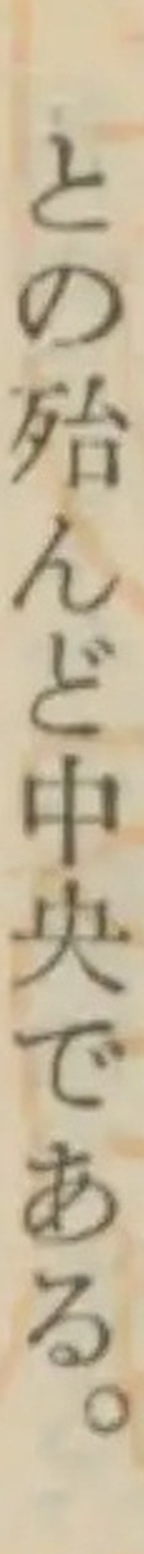との殆んど中央である。
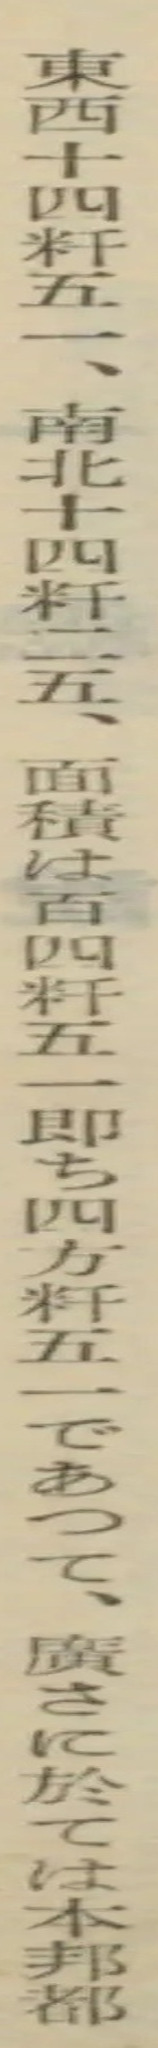東西十四粁五一、南北十四粁二五、面積は百四粁五一即ち四方粁五一であつて、広さに於ては本邦都
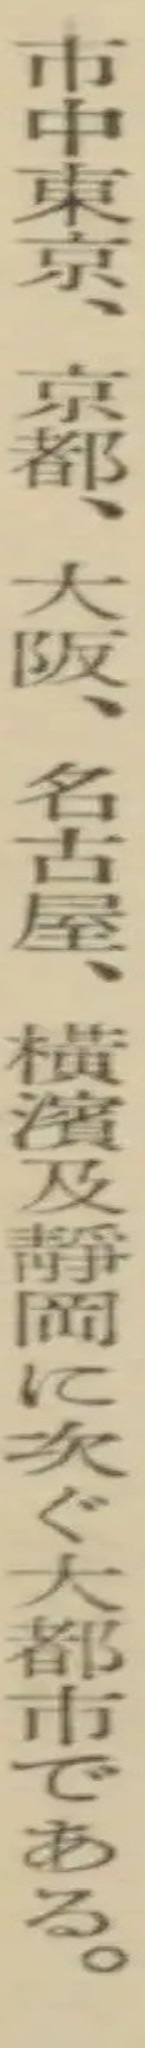市中東京、京都、大阪、名古屋、横浜及静岡に次ぐ大都市である。
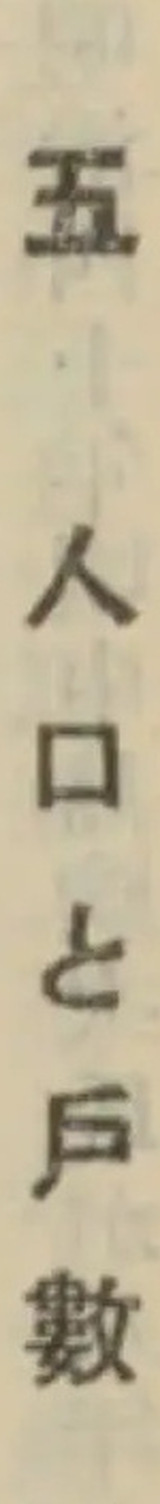五人口と戸数
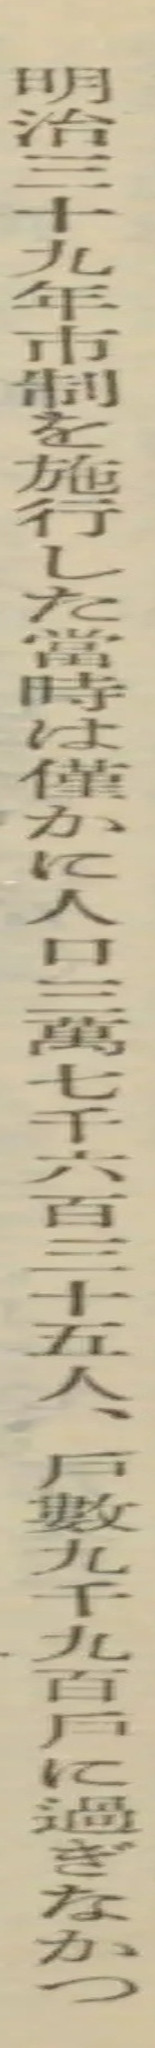明治三十九年市制を施行した当時は僅かに人口三万七千六百三十五人、戸数九千九百戸に過ぎなかつ
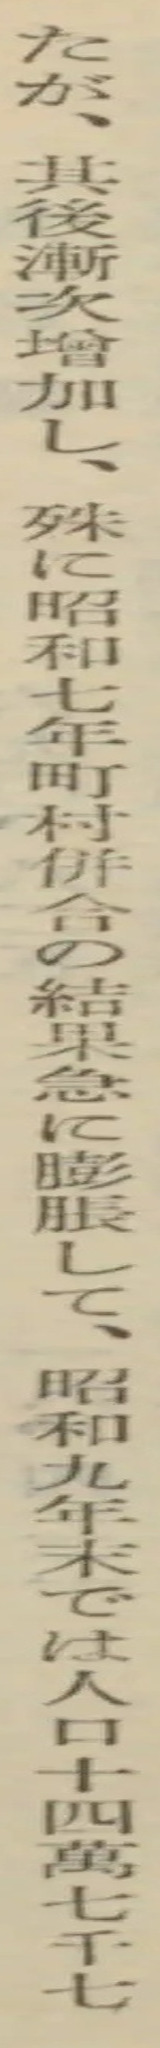たが、其後漸次増加し、殊に昭和七年町村併合の結果急に膨脹して、昭和九年末では人口十四万七千七
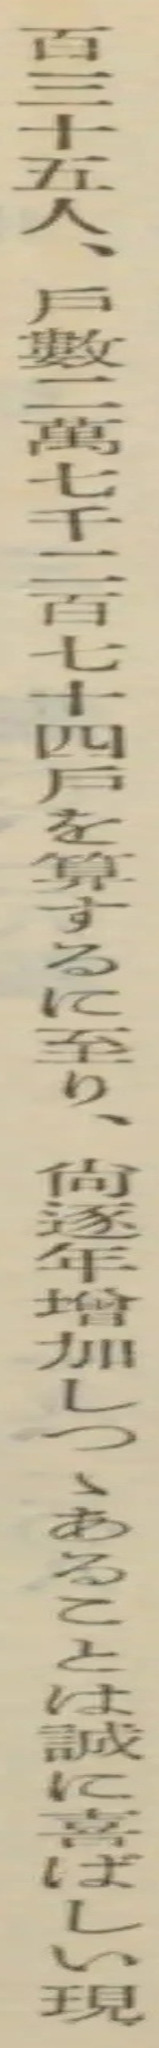百三十五人、戸数二万七千二百七十四戸を算するに至り、尚逐年増加しつゝあることは誠に喜ばしい現
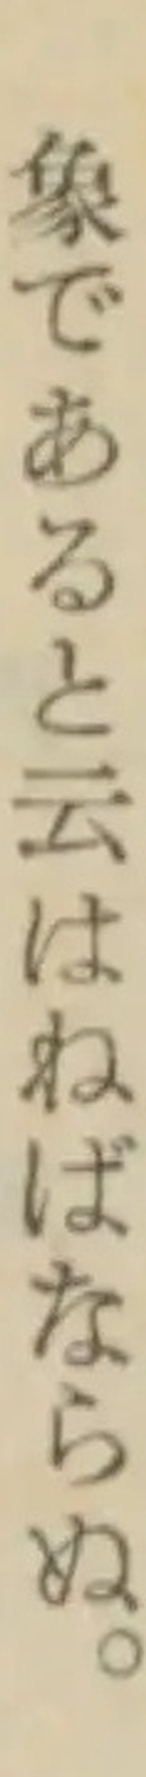象であると云はねばならぬ。
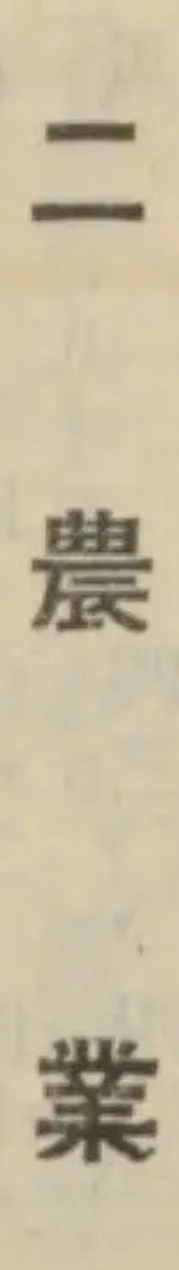二農業
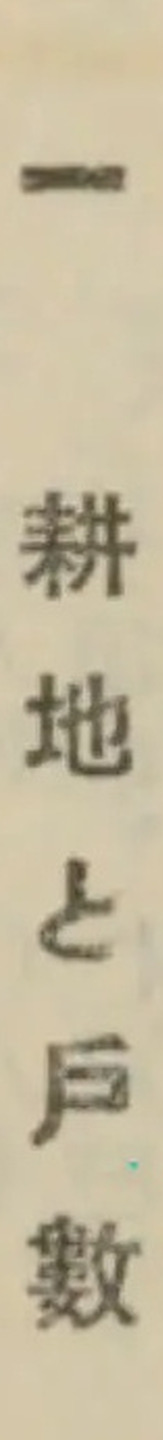一耕地と戸数
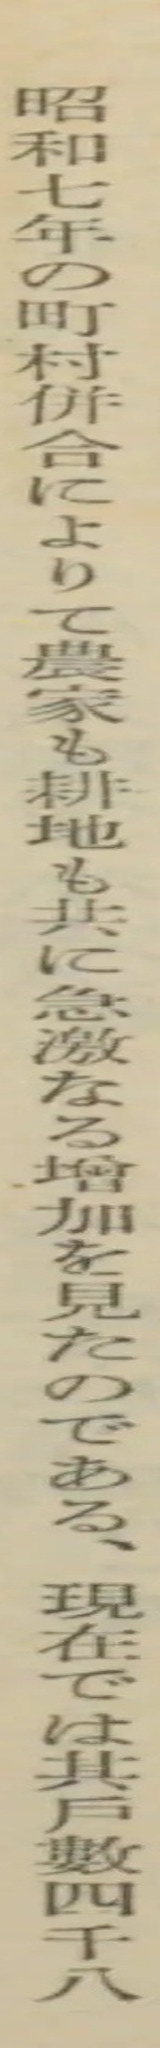昭和七年の町村併合によりて農家も耕地も共に急激なる増加を見たのである、現在では其戸数四千八
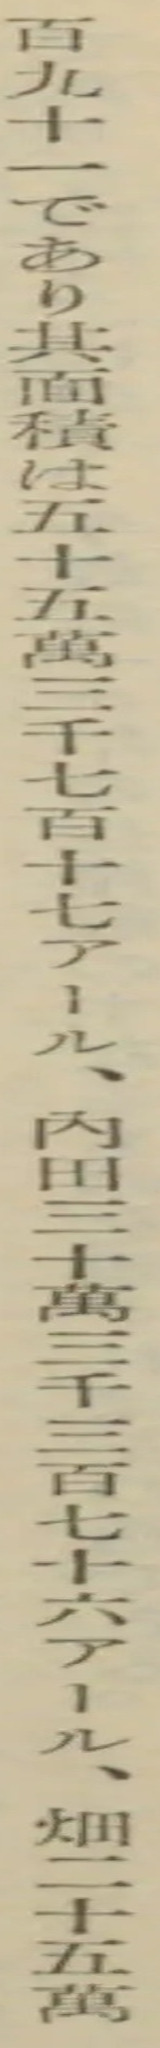百九十一であり其面積は五十五万三千七百十七アール、内田三十万三千三百七十六アール、畑二十五万
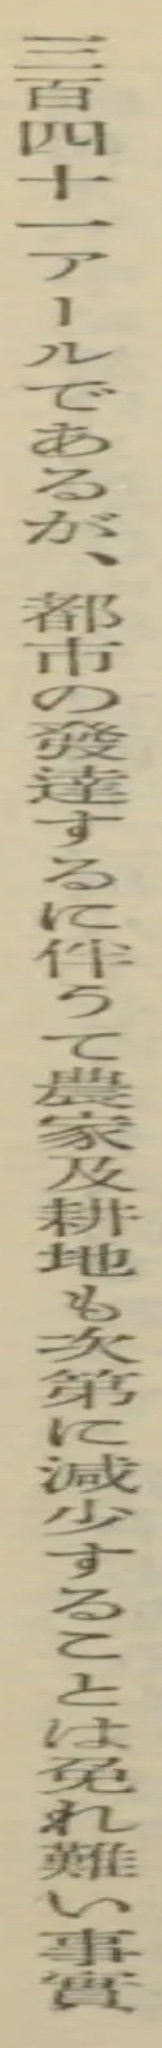三百四十一アールであるが、都市の発達するに伴うて農家及耕地も次第に減少することは免れ難い事実
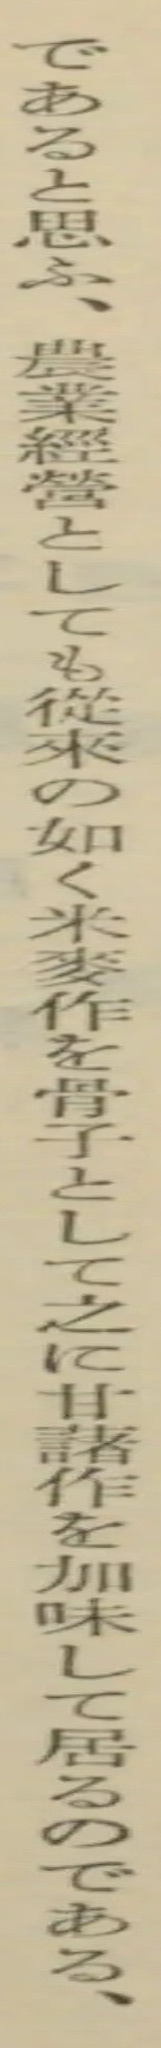であると思ふ、農業経営としても従来の如く米麦作を骨子として之に甘藷作を加味して居るのである、
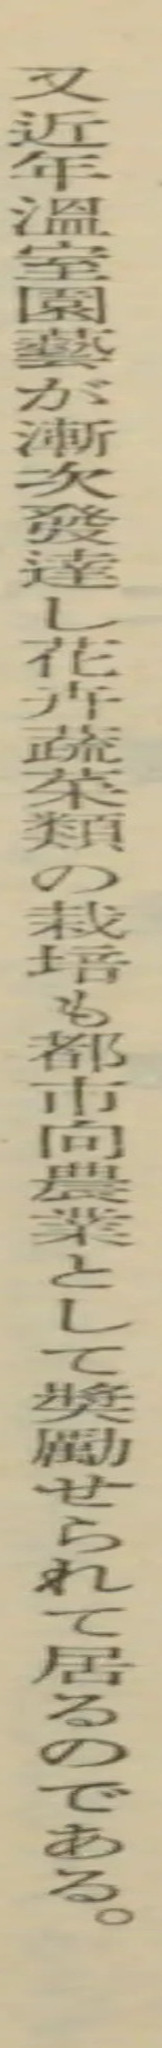又近年温室園芸が漸次発達し花卉蔬菜類の栽培も都市向農業として奨励せられて居るのである。

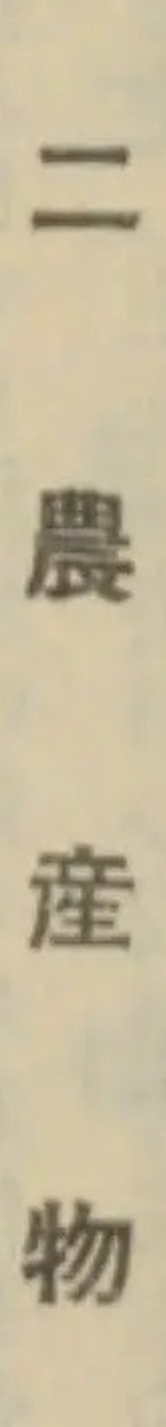二農産物
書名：産業の豊橋
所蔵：国立国会図書館 National Diet Library, JAPAN
